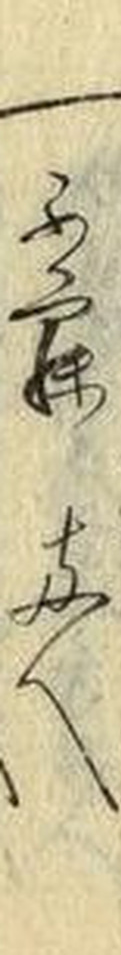不寝両人
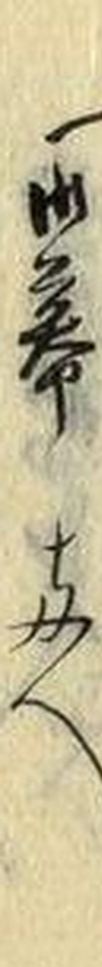御幕両人
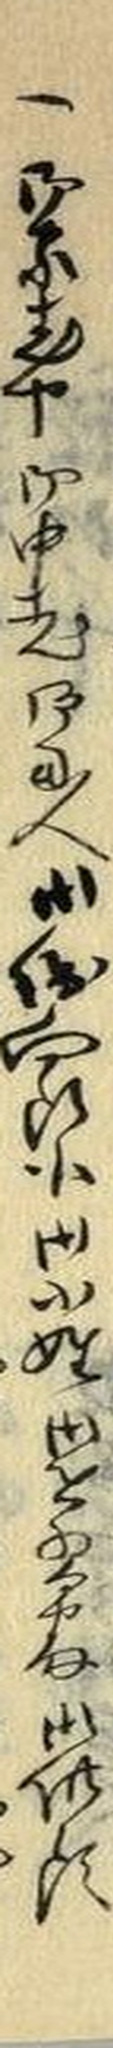一御家老中御中老御用人御側向頭取御小姓御近習番御供頭
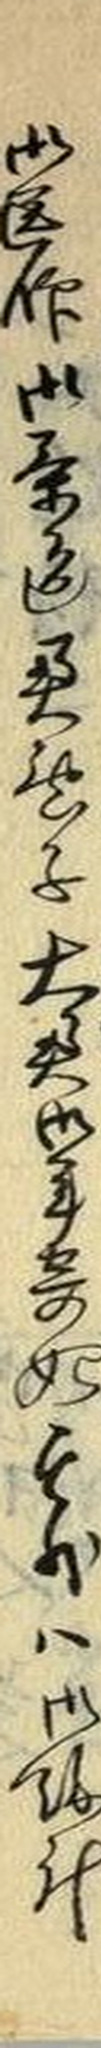御医師御茶道奥台子大奥御年寄始其外ハ御余計
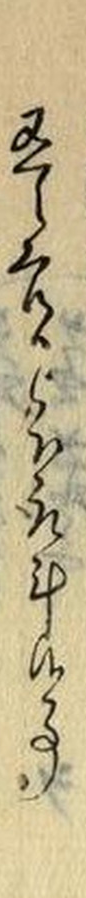有之節ハ被下取計候事
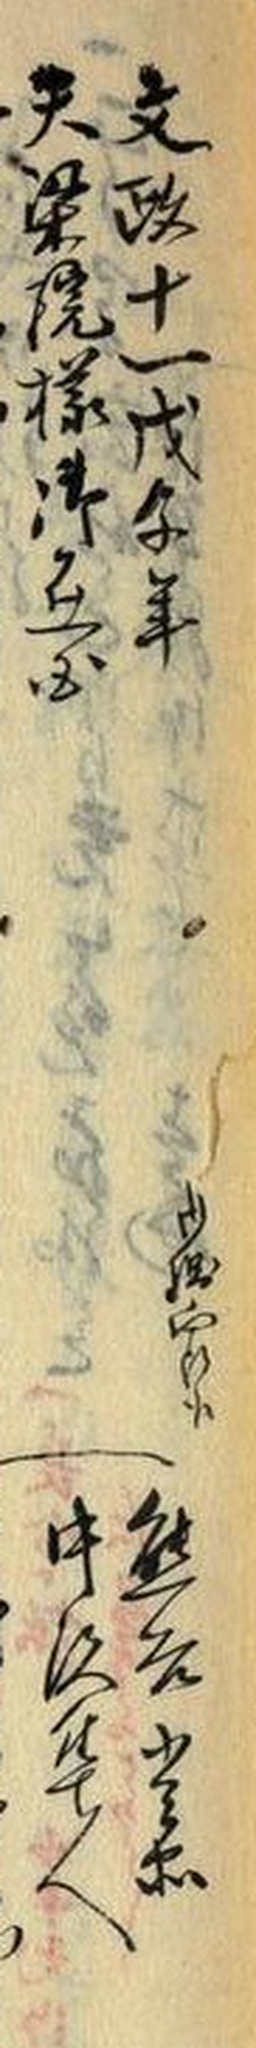天梁院様御在国中沢隼人
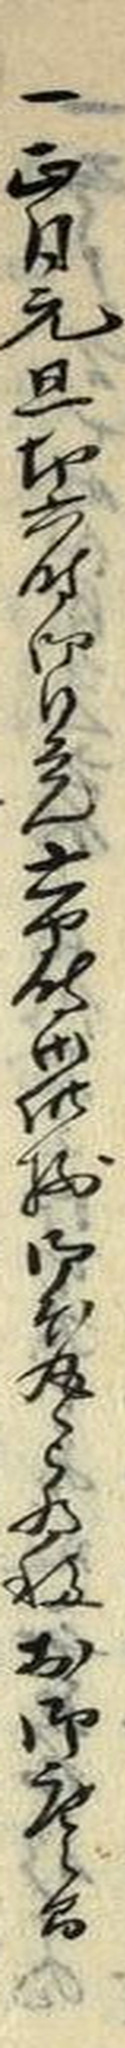一正月元旦切六時御目覚六半時御供揃御本丸へ被為移於御座之間
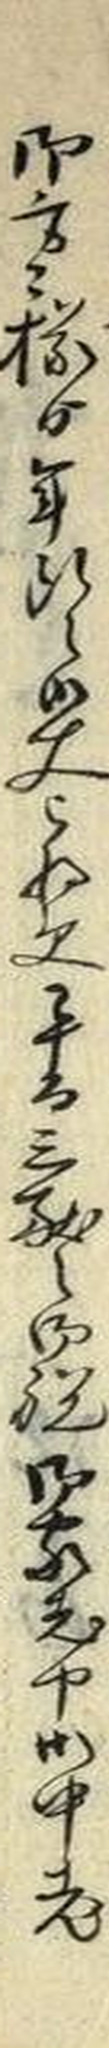御方々様ゟ年頭之御使被為受畢而三献之御祝御家老中御中老
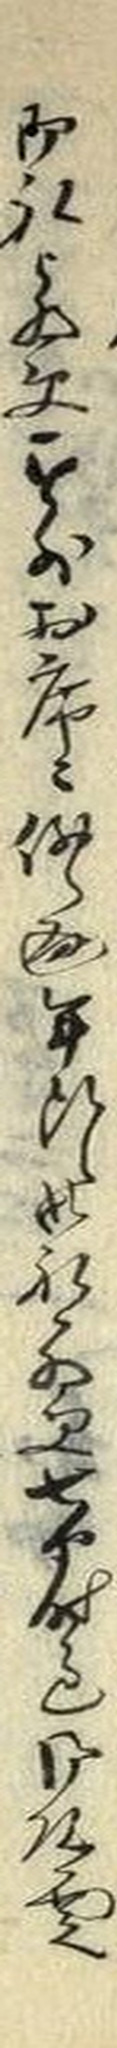御礼被為受其外於席々例之通年頭之御礼被為受七半時過御帰殿
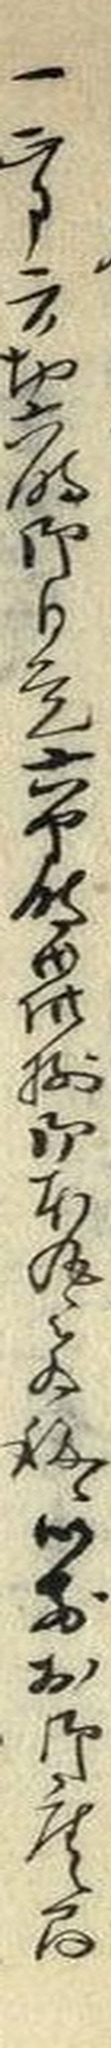一正月二日切六時御目覚六半時御供揃御本丸へ被為移候以前於御座之間
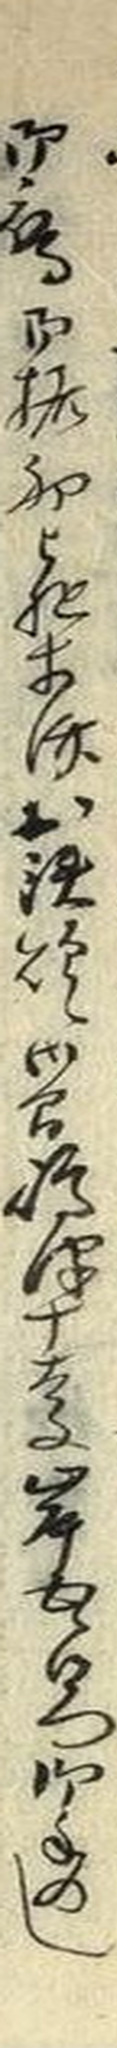御鷹御据初被遊相済於鉄炮之御間嶋津十太夫岸五郎左衛門御手のし
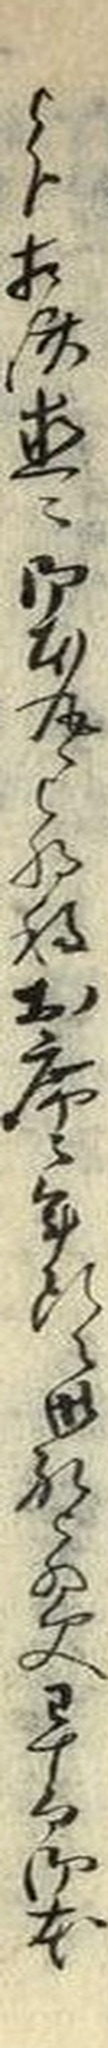被下相済直ニ御本丸へ被為移於席々年頭之御礼被為受畢而御本
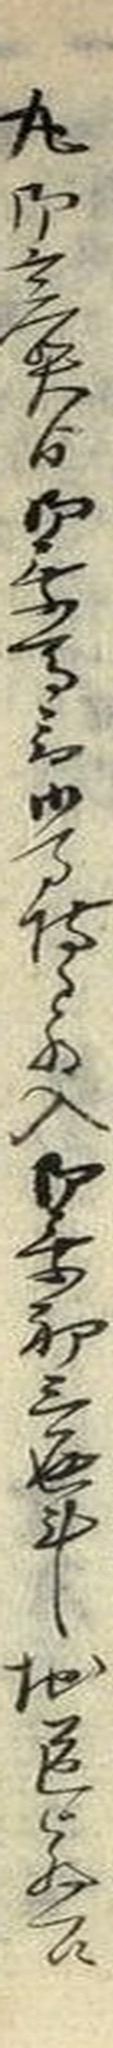丸御玄関ゟ御乗馬ニ而御馬場へ被為入御乗初三通斗地道被為召
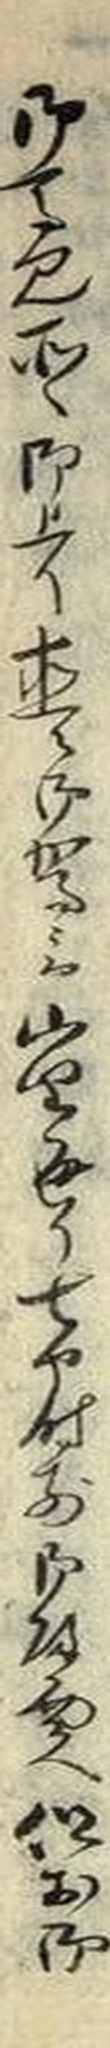御馬見所へ御上り直ニ御駕ニ而山里通り七半時前御帰殿但於御
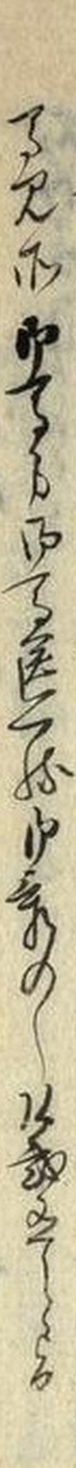馬見所御馬方御馬医一統御影のし頂戴有之候旨
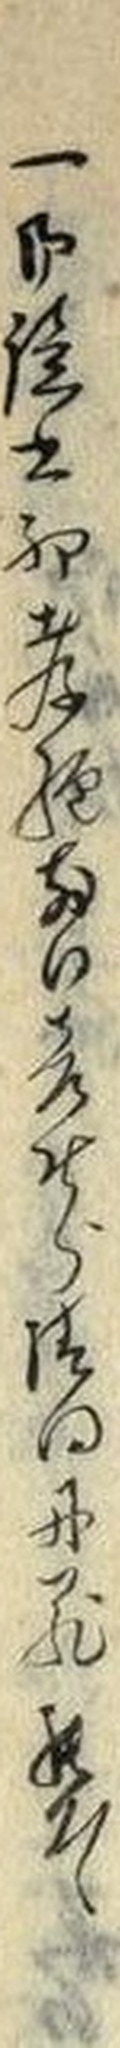一御読書初孝経前田彦次郎清田丹蔵罷出候
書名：少傅日録抄（斉承付側向頭取日記、在国）
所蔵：福井県文書館 Fukui Prefectural Archives
